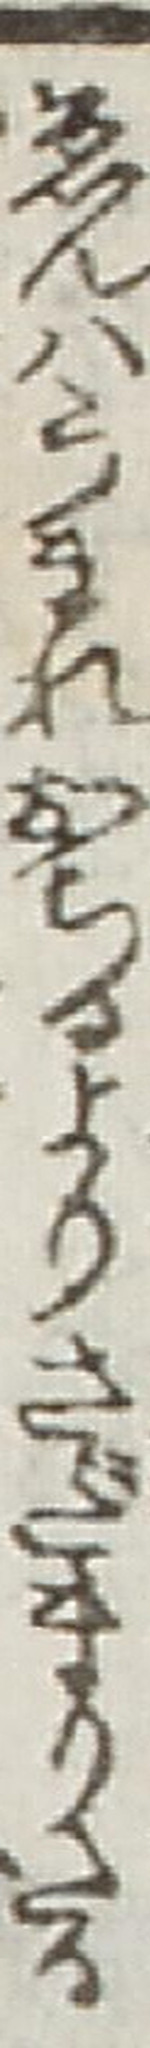ゑんはうまれおちるよりさだまりたる
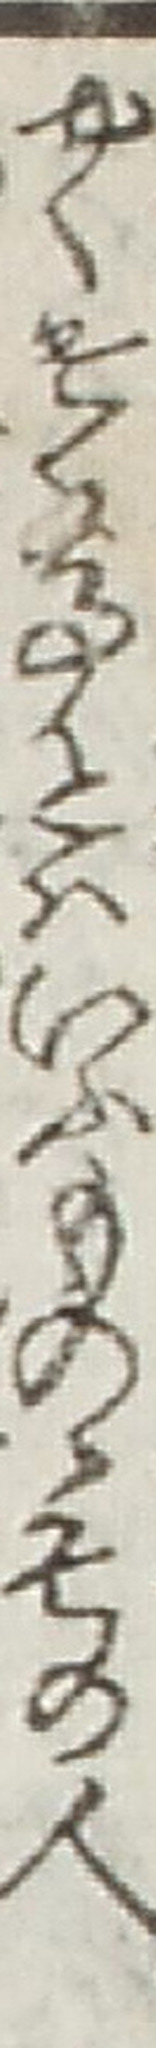やくそく事とはいふものゝその人
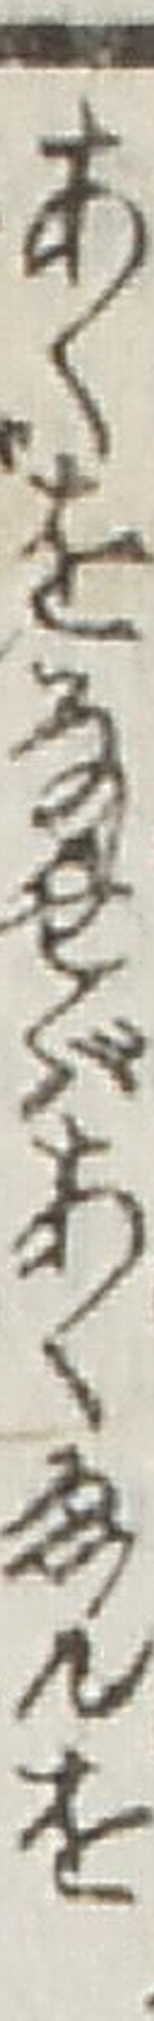あくをなせばあくゑんを
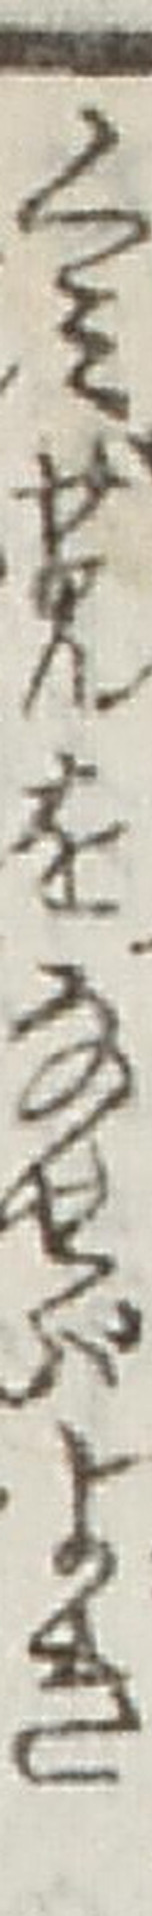くみぜんをなせばよき
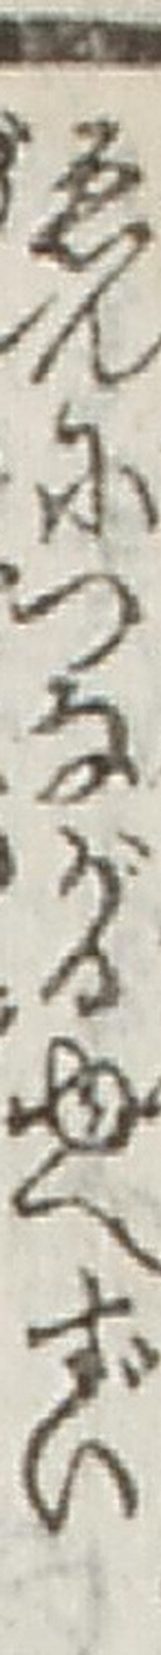ゑんにつながるゆへずい
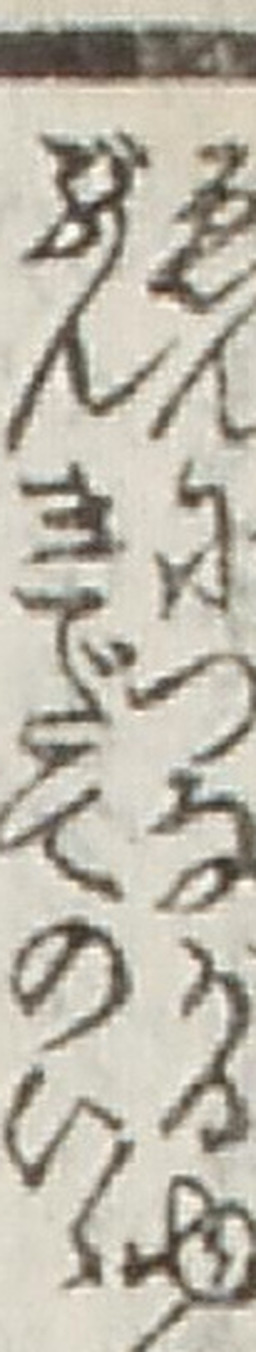ぶんきだてのいゝ
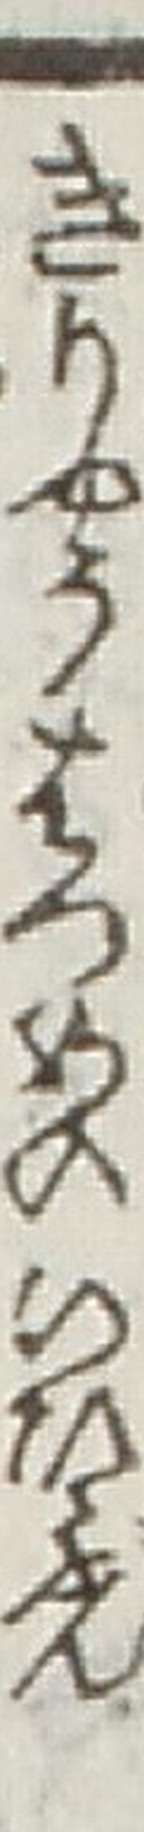きりやうはつめいいひぶん
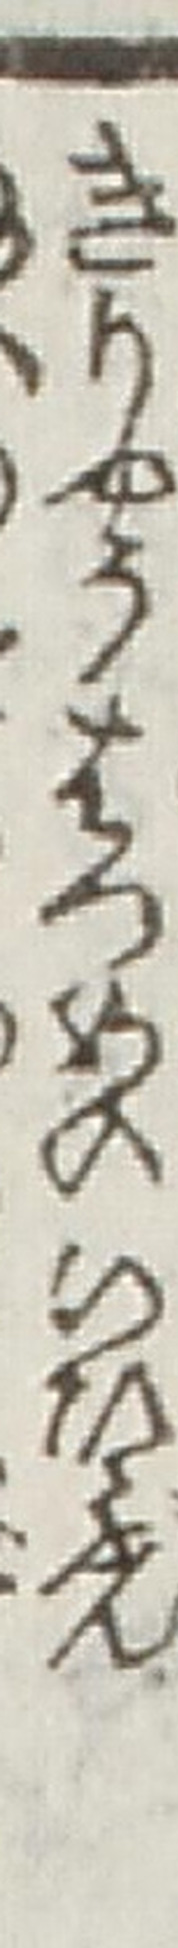きりやうはつめいいひぶん
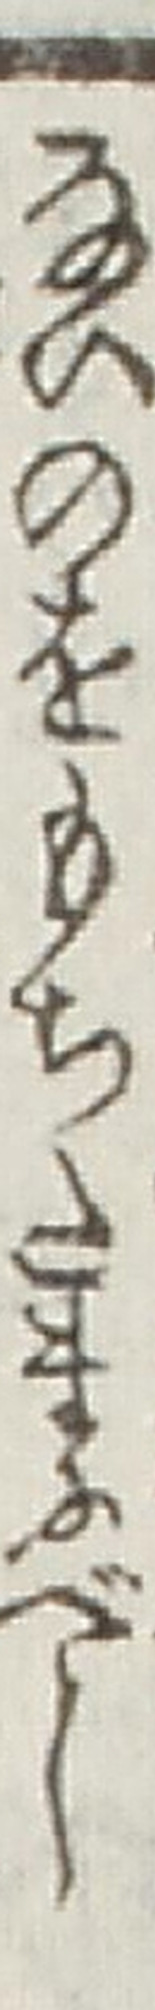ないのをもちたまふべし
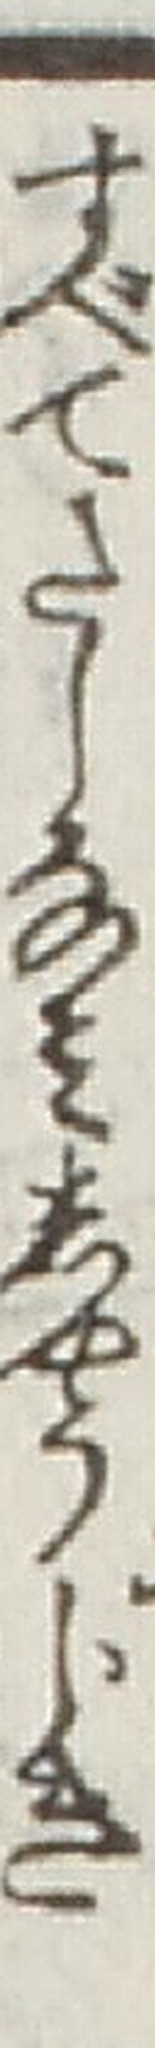すべてたしなみしやうじき
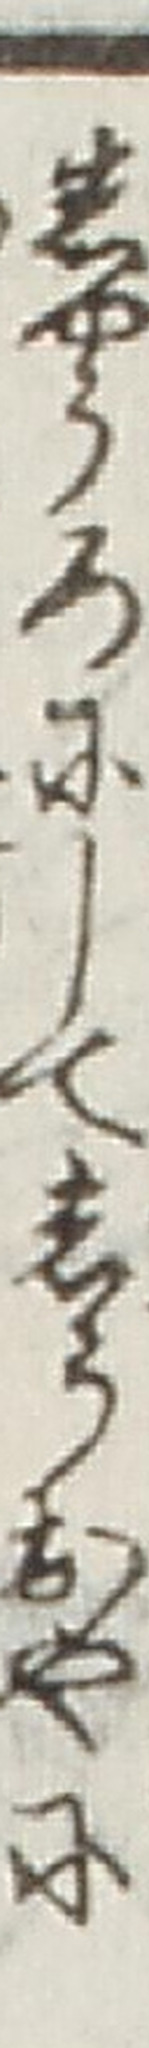しやうろにしてしうおやに
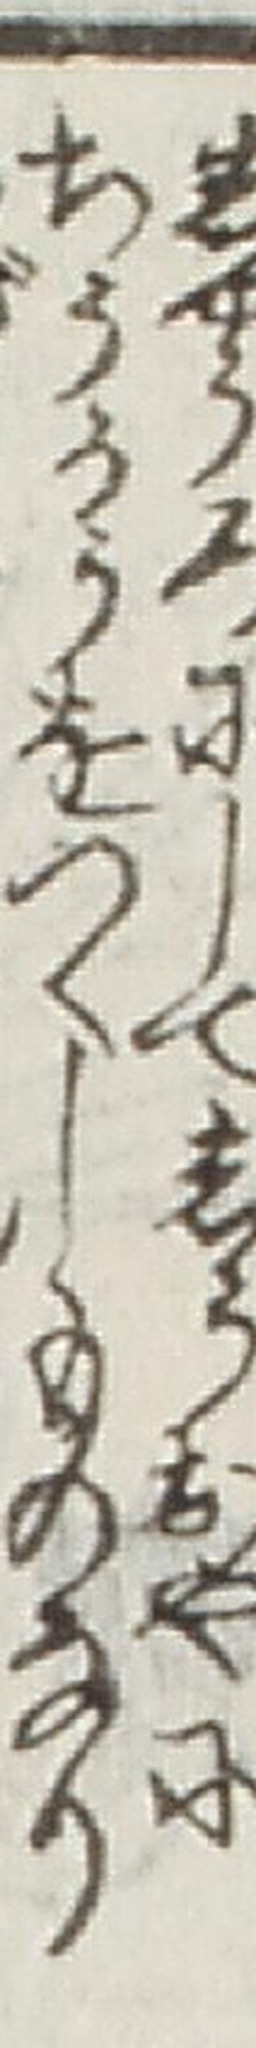ちうかうをつくしものなり
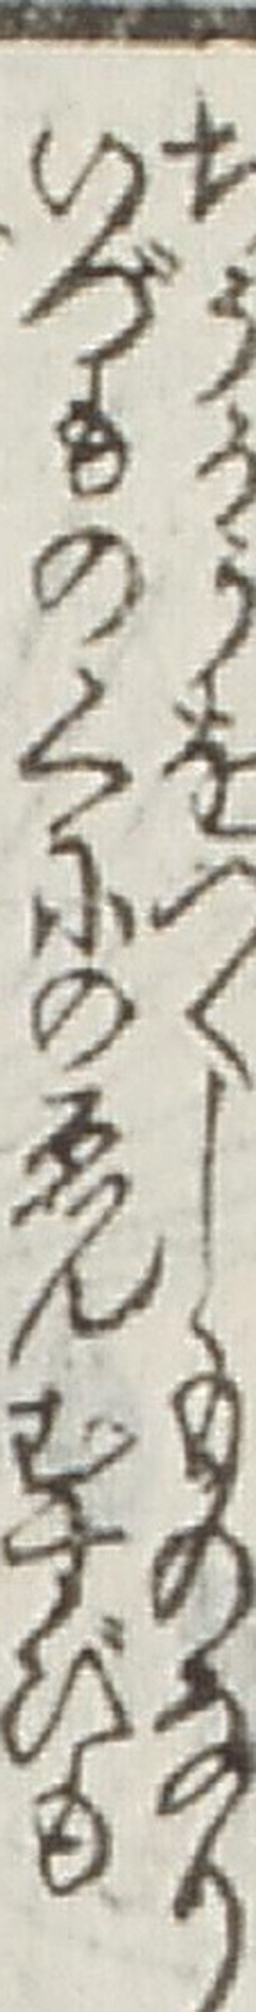いづものくにのゑんむすびも
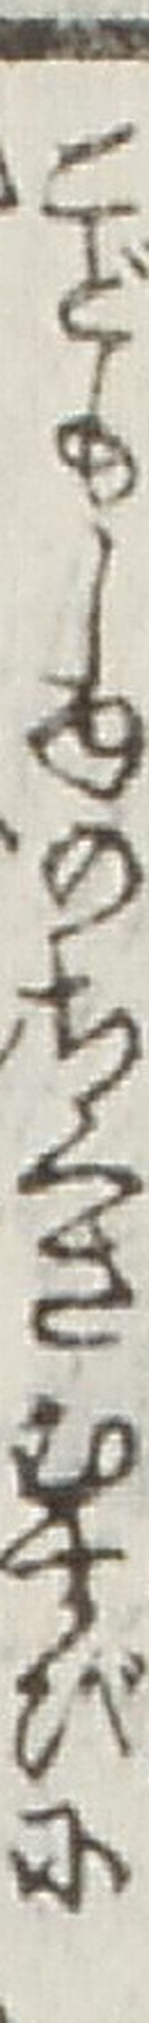こどもしゆのちくさむすびに
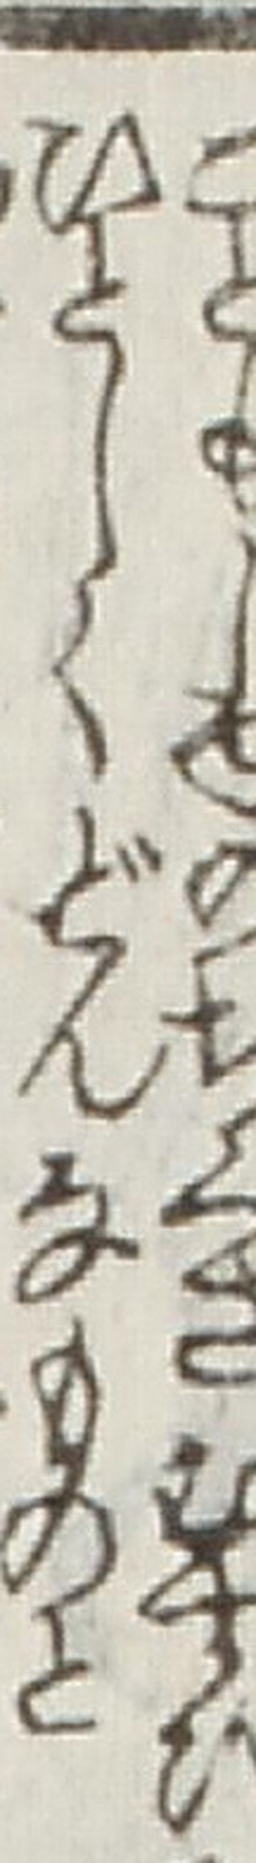ひとしくどんなものと
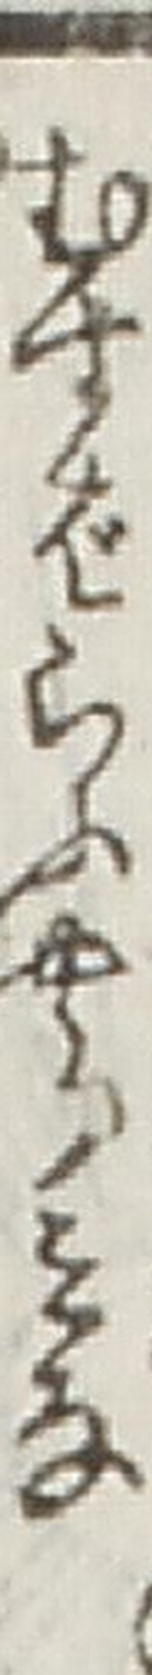むすばらふやらみな
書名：三世相出雲當座帳　上下冊
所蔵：東京大学地震研究所図書室 Earthquake Research Institute Library, The University of Tokyo, JAPAN
